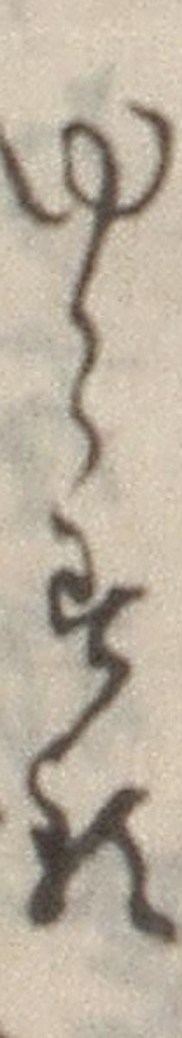ゆらする
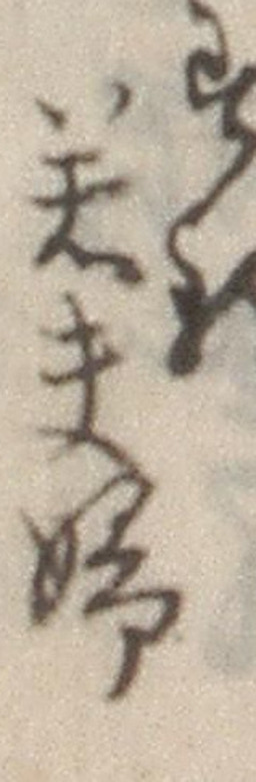若夫婦
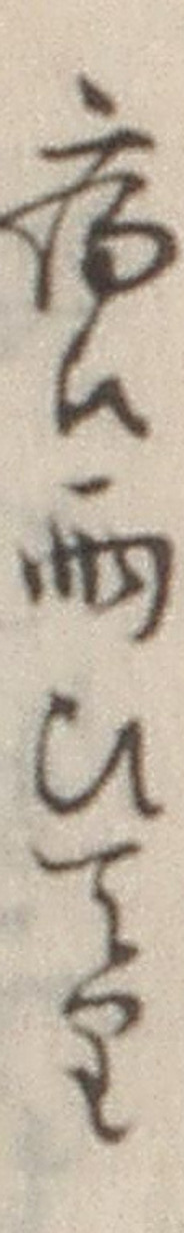病に雨ひてり
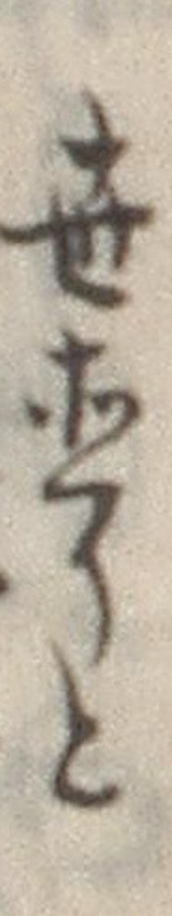世直りと
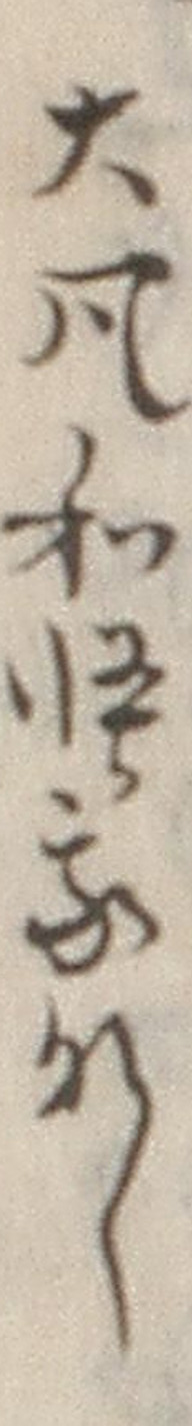大風和怪我なし
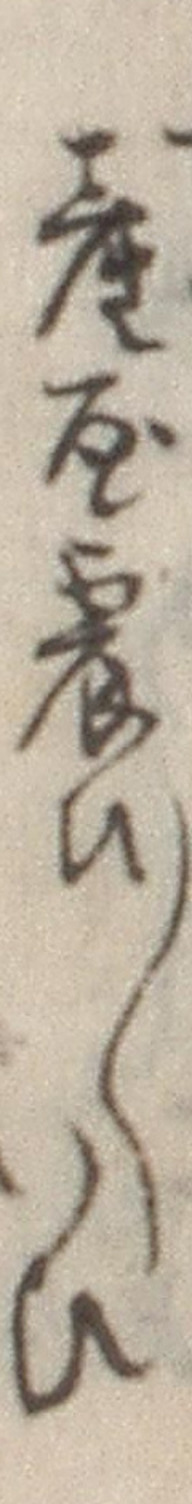産屋震ひ〳〵いひ
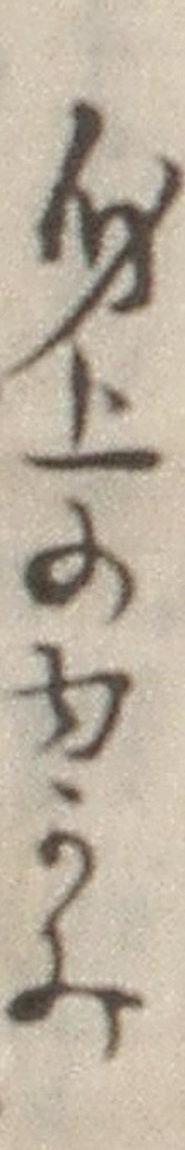身上のゆかみ
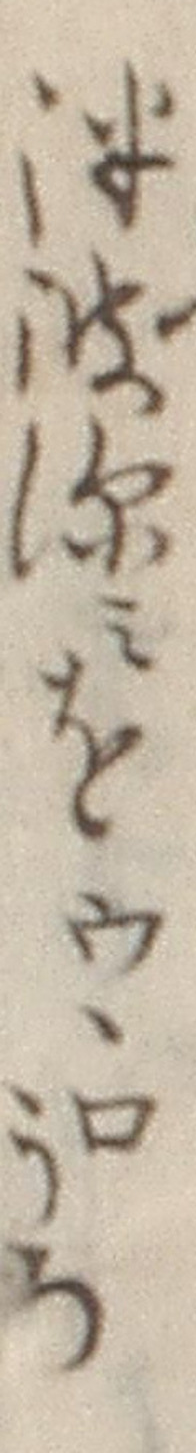津波深みをウヽロうろ
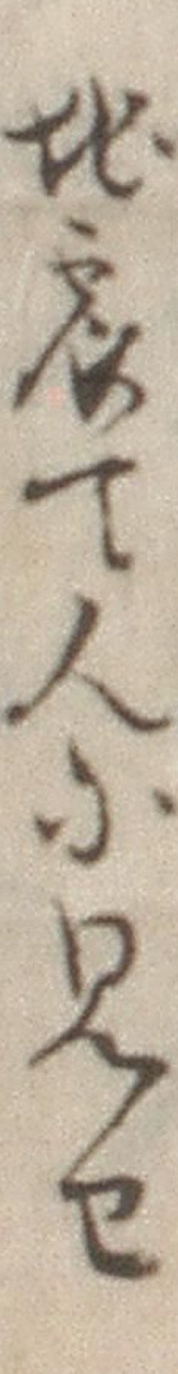地震て人に見せ
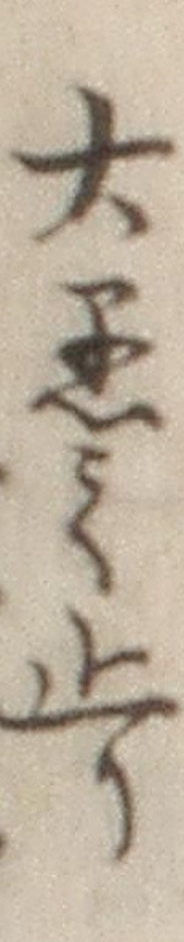大黒て止り
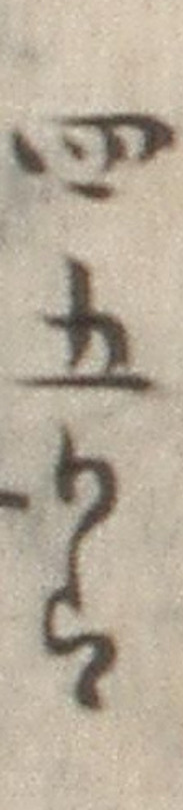四五日は
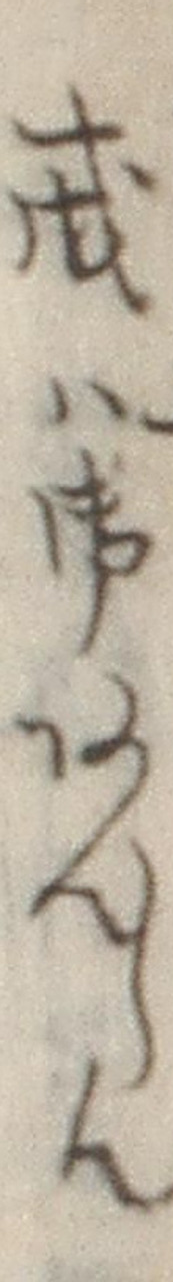戎は御あんしん
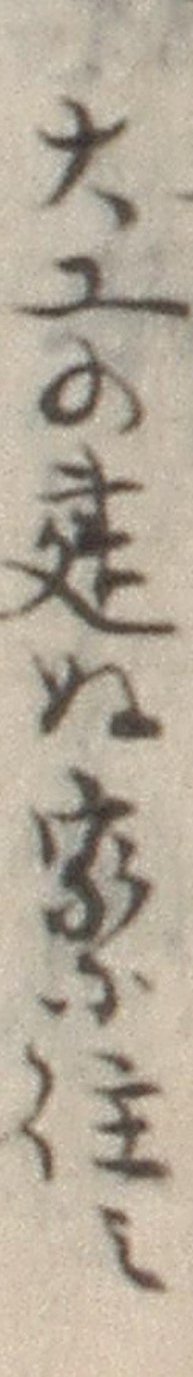大工の建ぬ家に住み
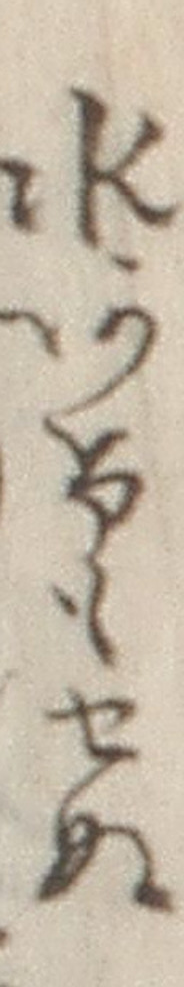水あけもせぬ
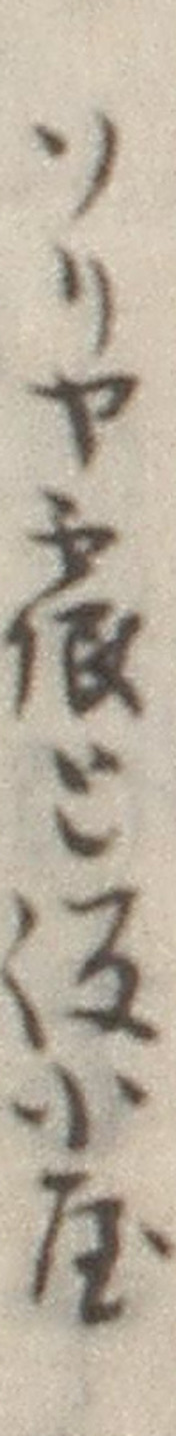ソリヤ震と仮小屋
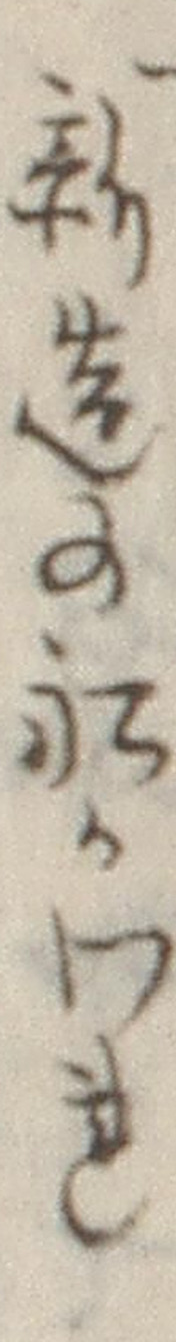新造の舩かわれ
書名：諸國大地震年代記末代噺種
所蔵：東京大学地震研究所図書室 Earthquake Research Institute Library, The University of Tokyo, JAPAN
